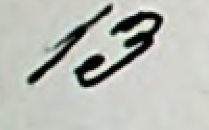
13
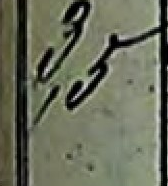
3,5
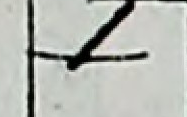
I
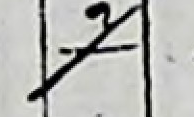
7
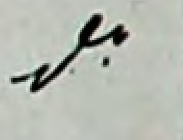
do
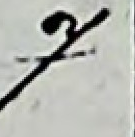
7
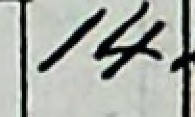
14
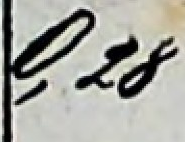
0,28
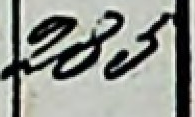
285
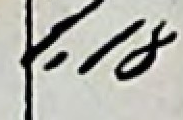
1,18
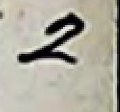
2
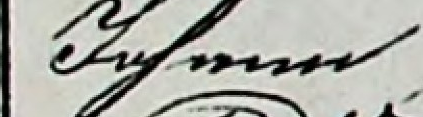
Johann
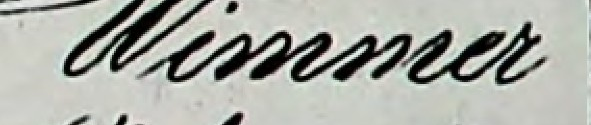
Wimmer
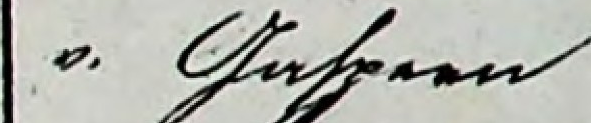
v. Gaspern
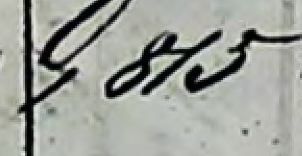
0,815
